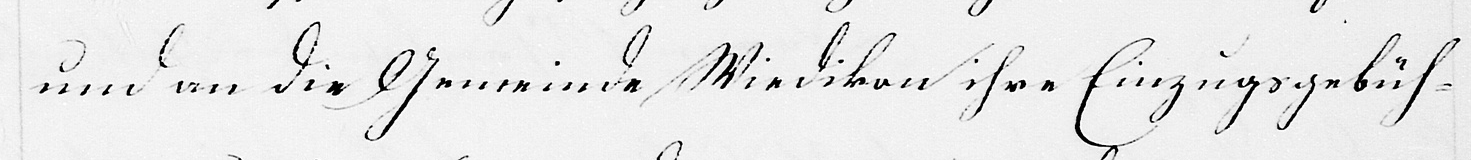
und an die Gemeinde Wiedikon ihre Einzugsgebüh¬
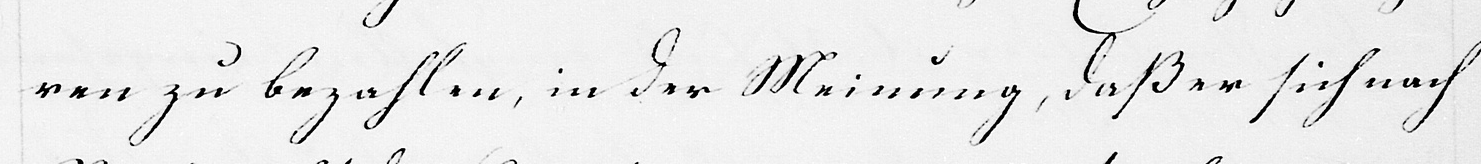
ren zu bezahlen, in der Meinung, daß er sich nach
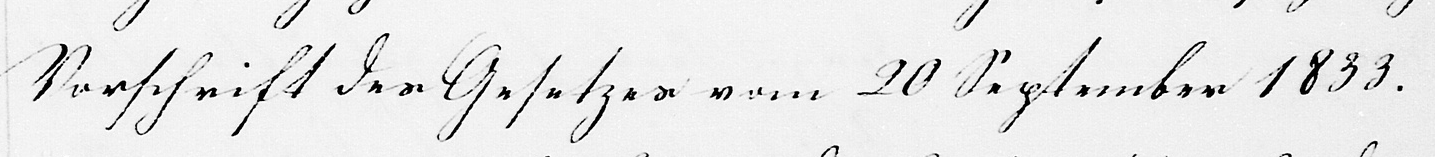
Vorschrift des Gesetzes vom 20 September 1833.
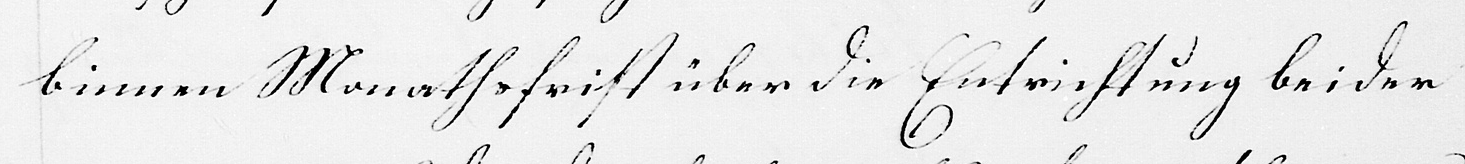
binnen Monathsfrist über die Entrichtung beider
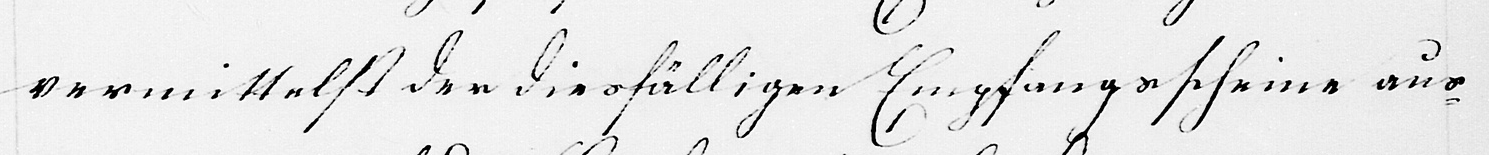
vermittelst der diesfälligen Empfangsscheine aus¬
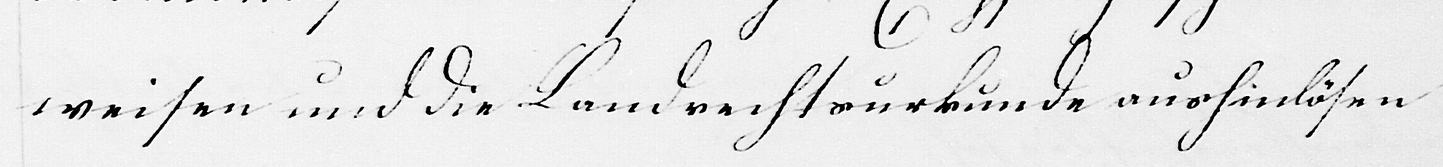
weisen und die Landrechtsurkunde aushinlösen
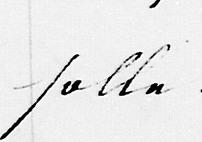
solle.
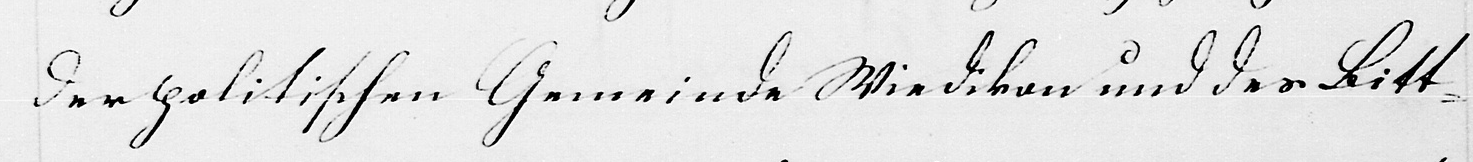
der politischen Gemeinde Wiedikon und des Bitt¬
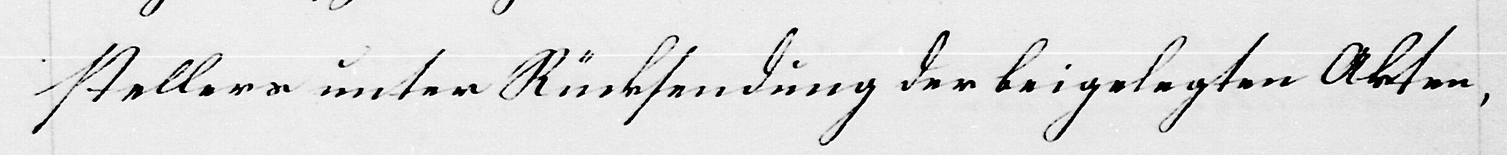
stellers unter Rücksendung der beigelegten Akten,
